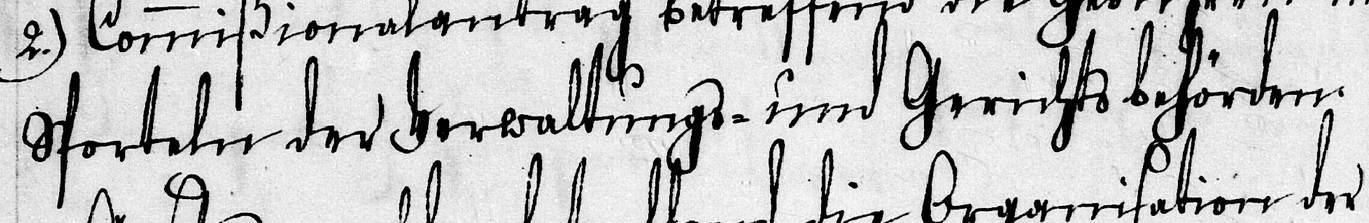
Sporteln der Verwaltungs- und Gerichtsbehörden.
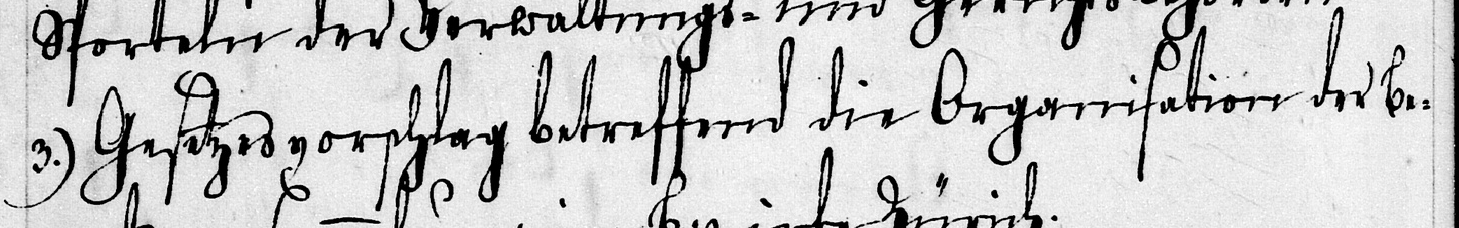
3.) Gesetzesvorschlag betreffend die Organisation der Be¬
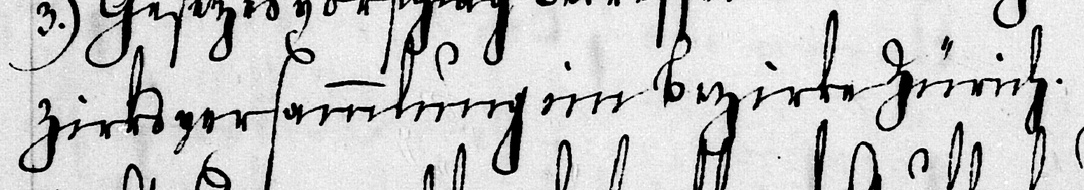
zirksversammlung im Bezirke Zürich.
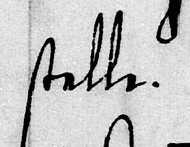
telle.
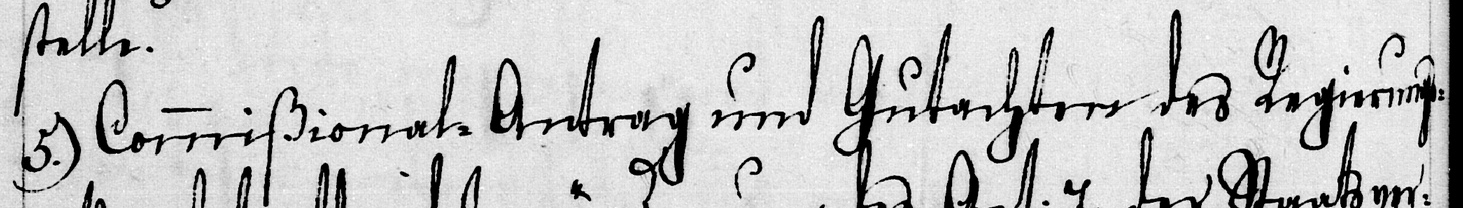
5.) Commißional-Antrag und Gutachten des Regierung¬
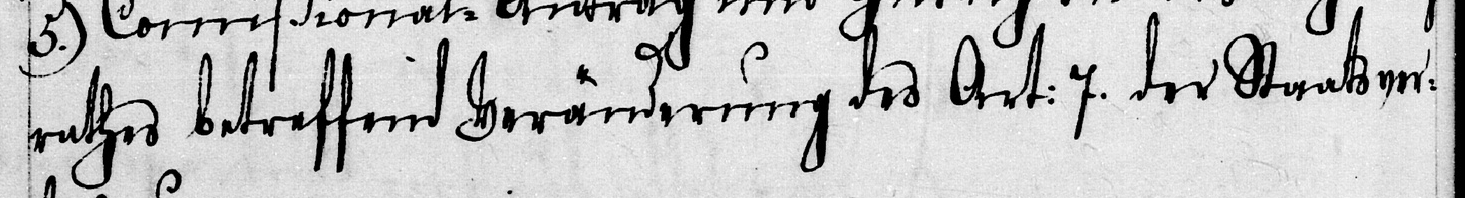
srathes betreffend Veränderung des Art: 7. der Staatsver¬
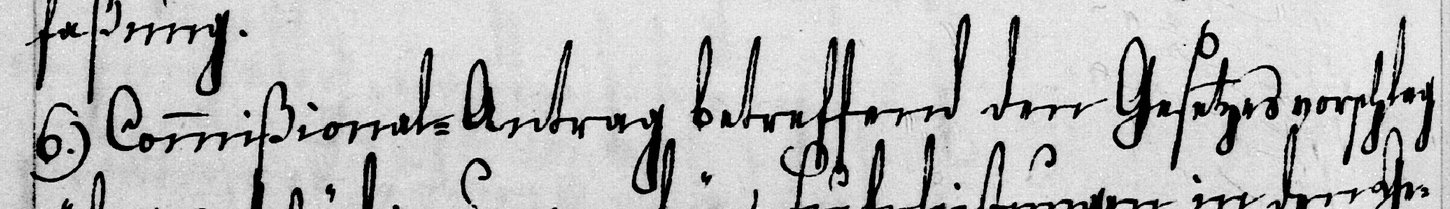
6.) Commißional-Antrag betreffend den Gesetzesvorsc¬
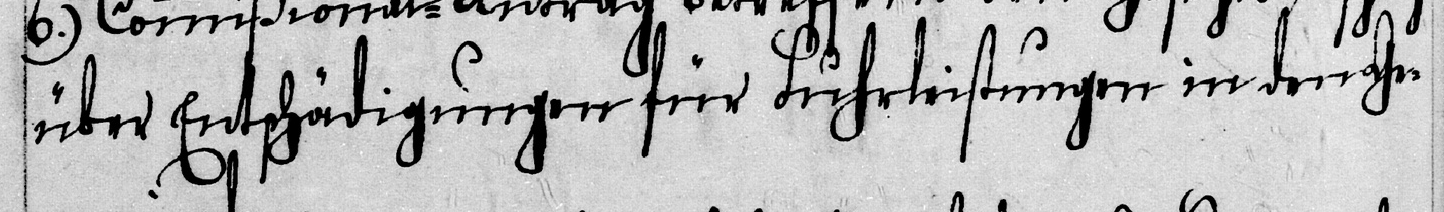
über Entschädigungen für Fuhrleistungen in den Ge¬
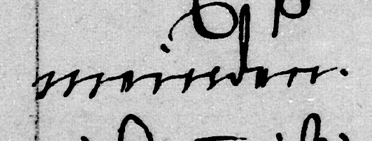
meinden.
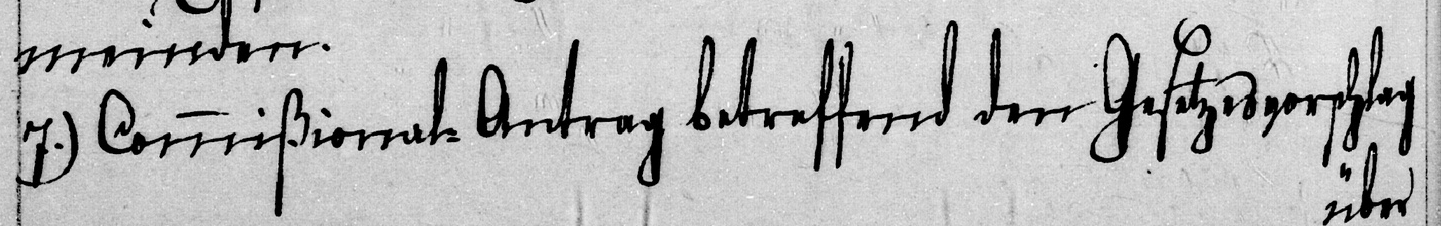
7.) Commißional-Antrag betreffend den Gesetzesvorsch¬
